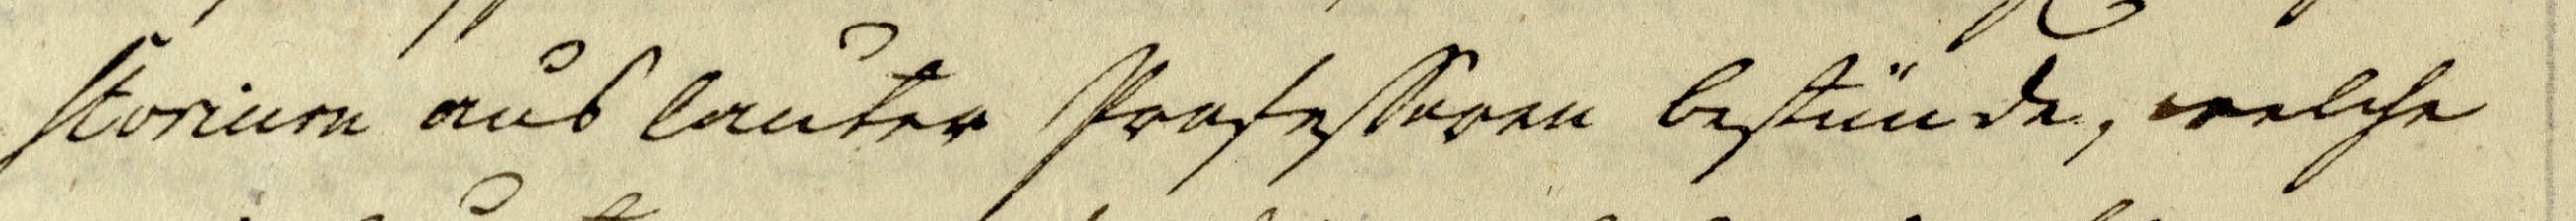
storium aus lauter Professoren bestünde, welche
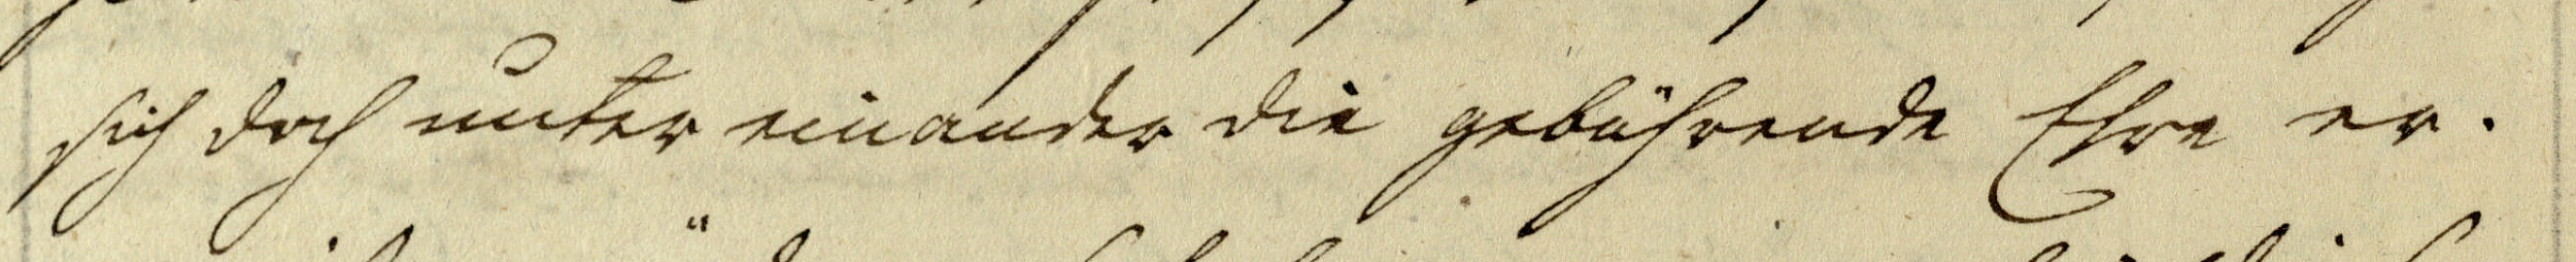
sich doch unter einander die gebührende Ehre er¬
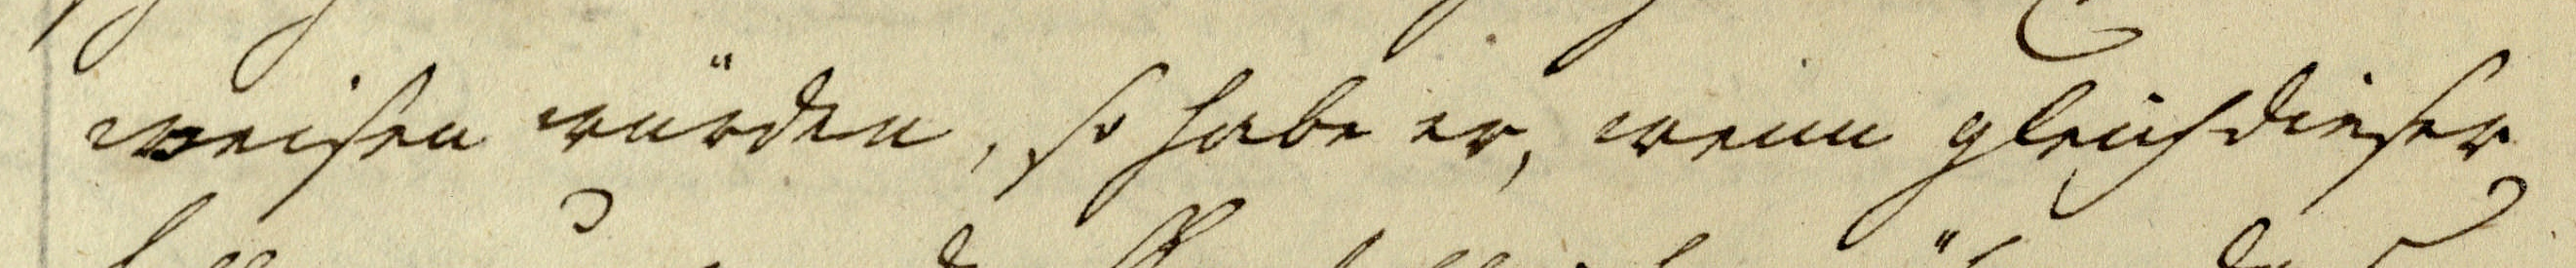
weisen würden, so habe er, wenn gleich dieser
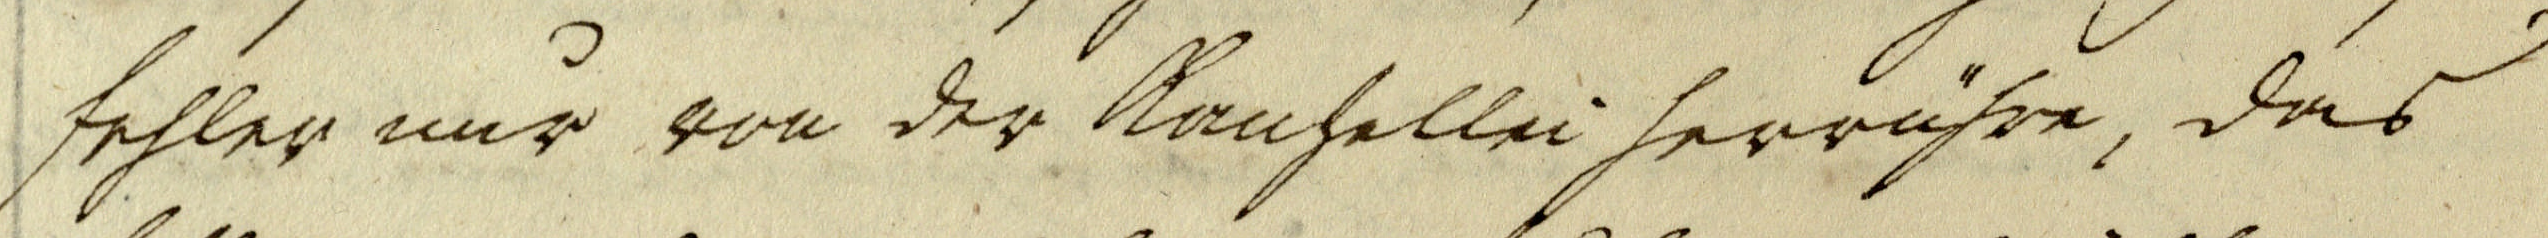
Fehler nur von der Kanzellei herrühre, das
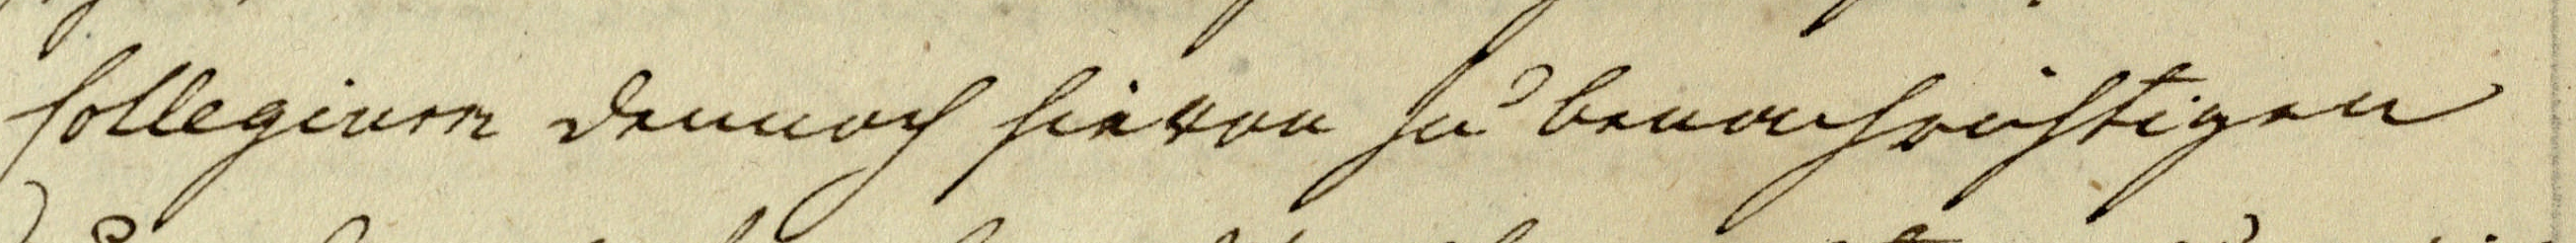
Collegium dennoch hievon zu benachrichtigen
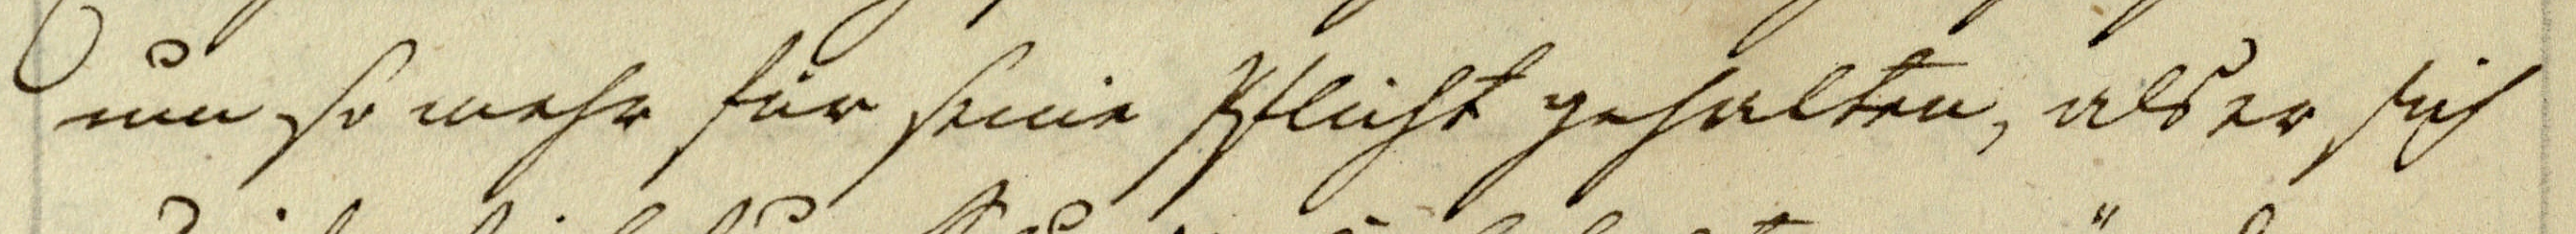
um so mehr für seine Pflicht gehalten, als er sich
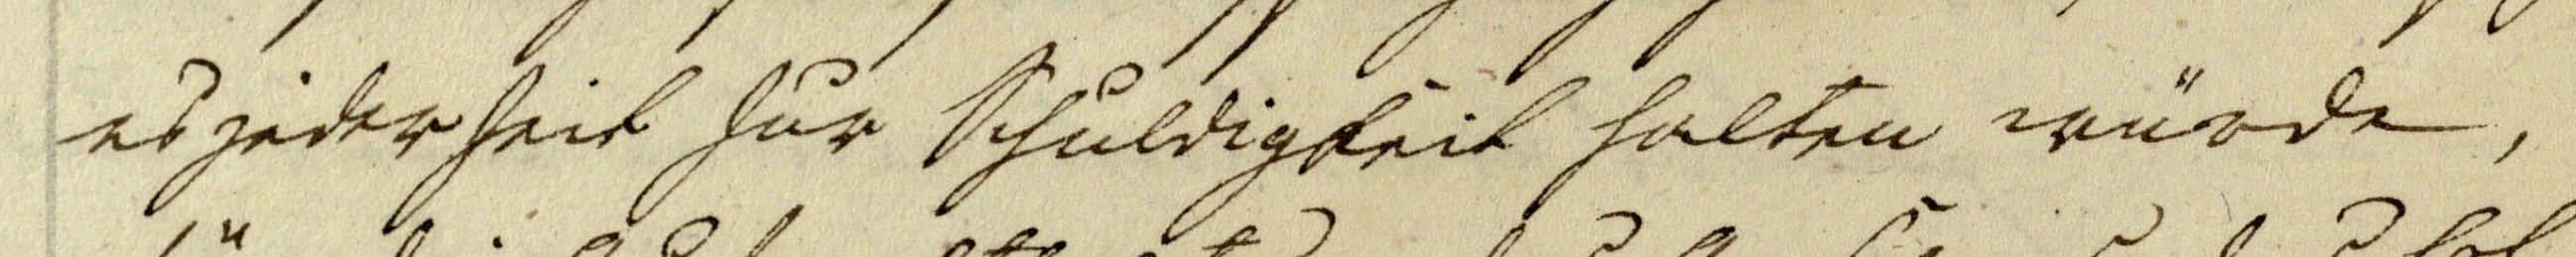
es jederzeit zur Schuldigkeit halten würde,
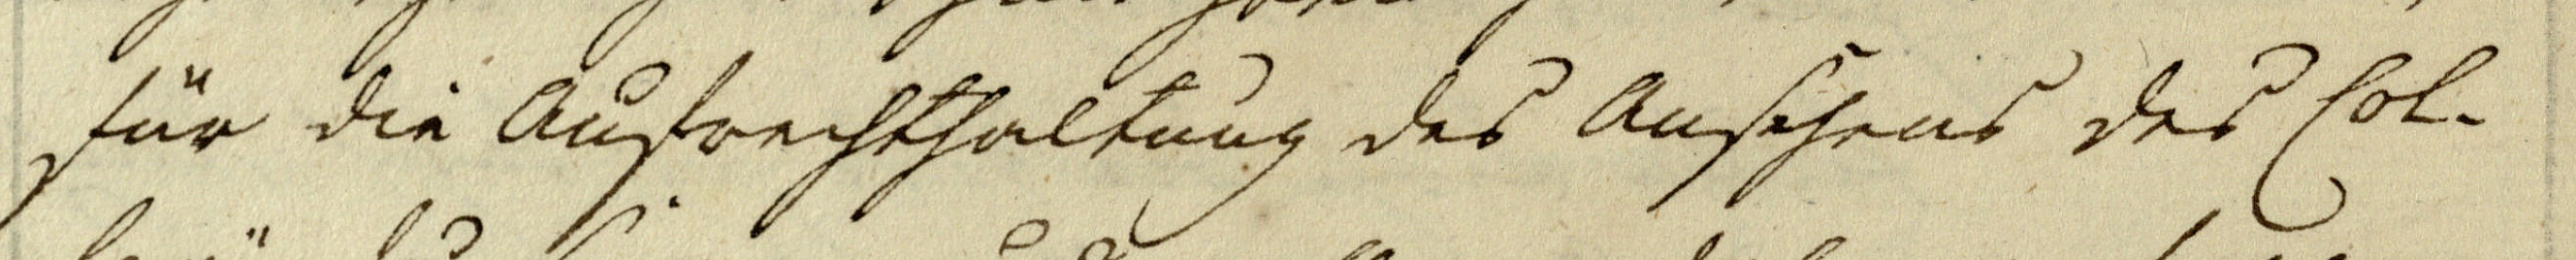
für die Aufrechthaltung des Ansehens des Col¬
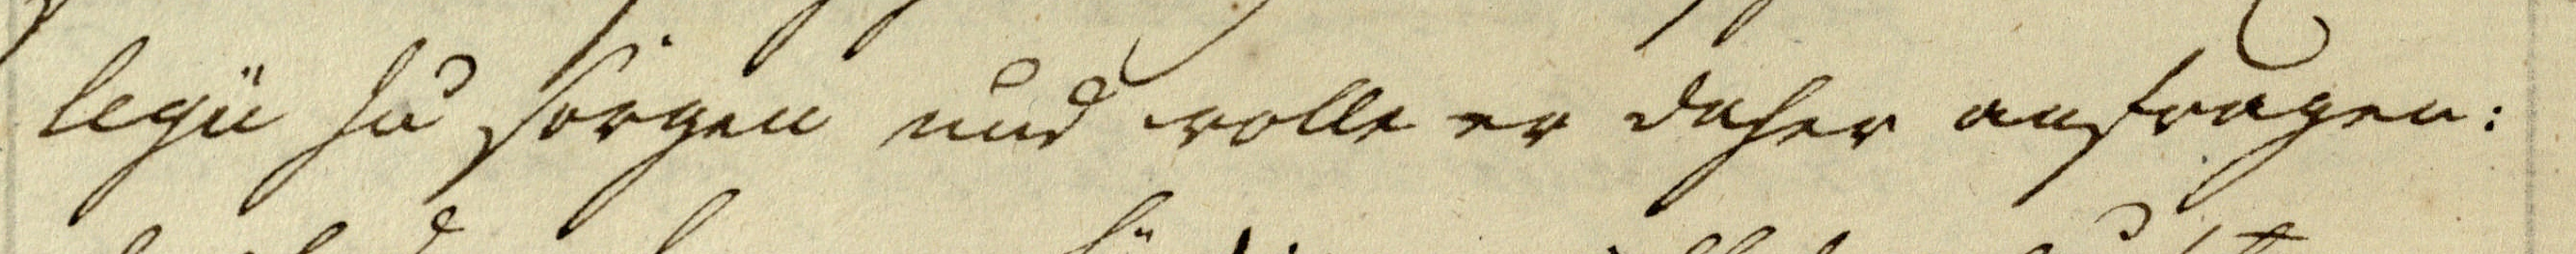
legii zu sorgen und wolle er daher anfragen:
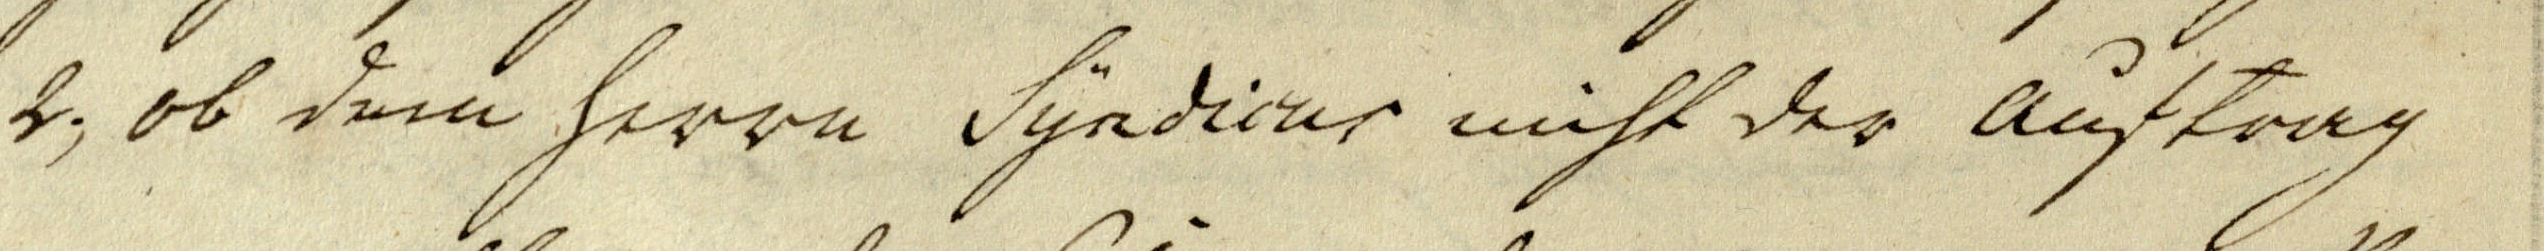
2, ob dem Herrn Sÿndicus nicht der Auftrag
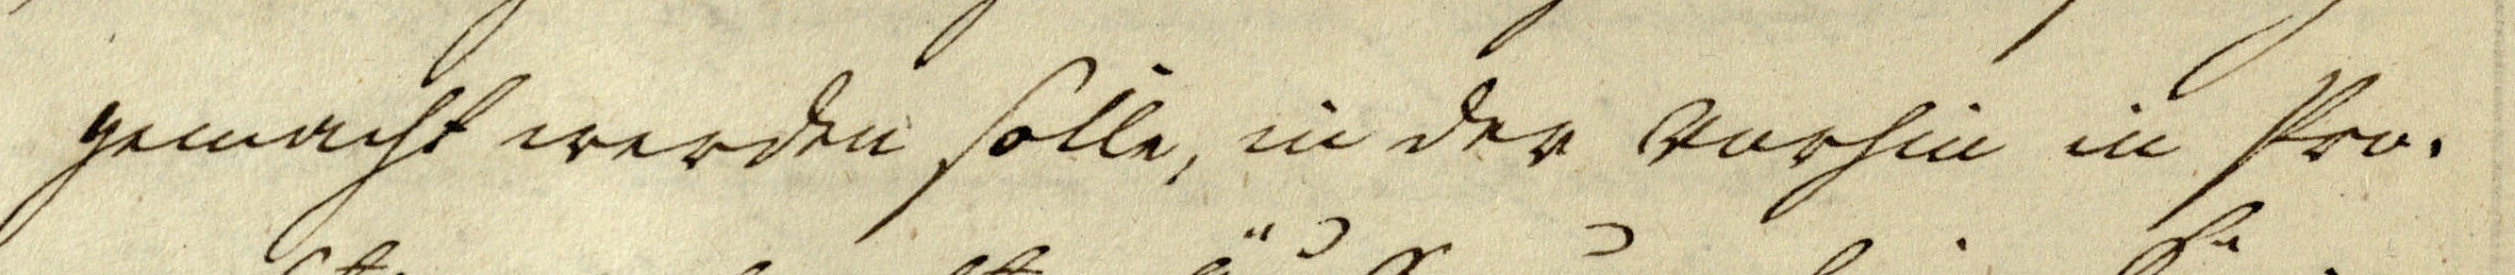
gemacht werden solle, in der vorhin in Pro¬
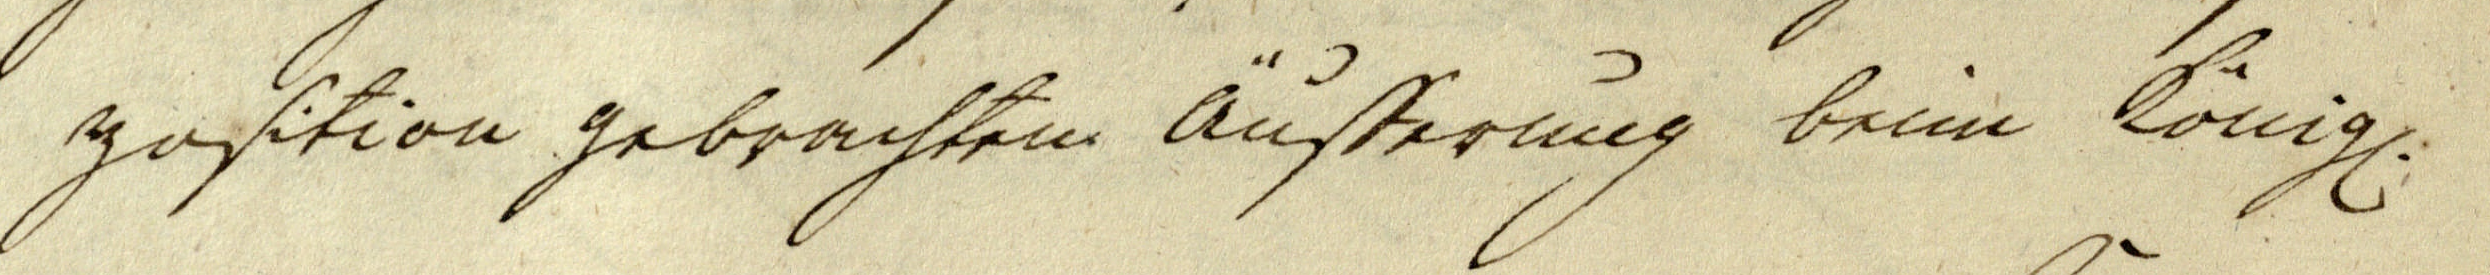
position gebrachten Äusserung beim Königl.
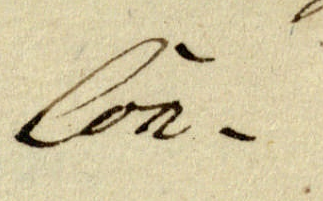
Con¬
